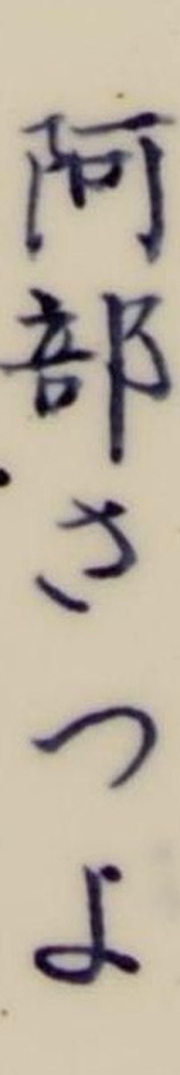阿部さつよ
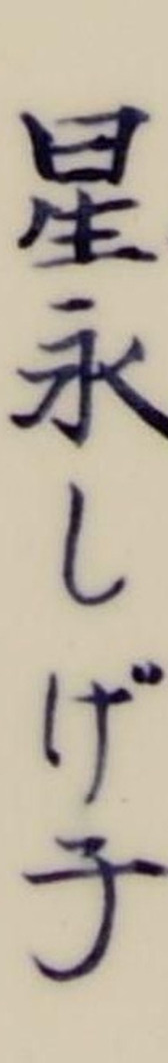星永しげ子
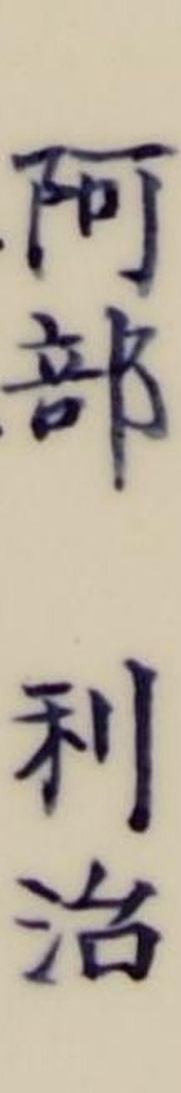阿部利治
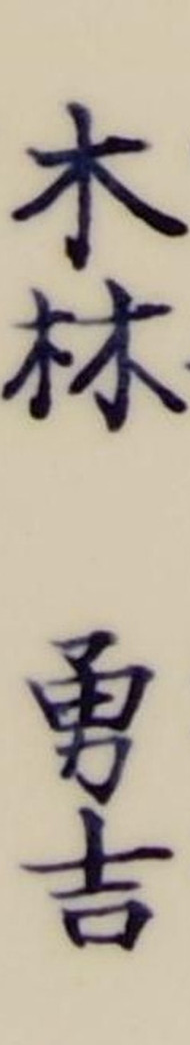木林勇吉
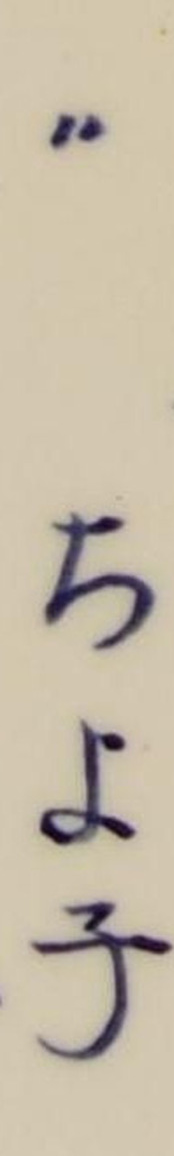ちよ子
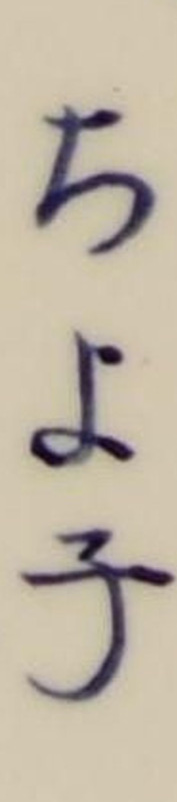ちよ子
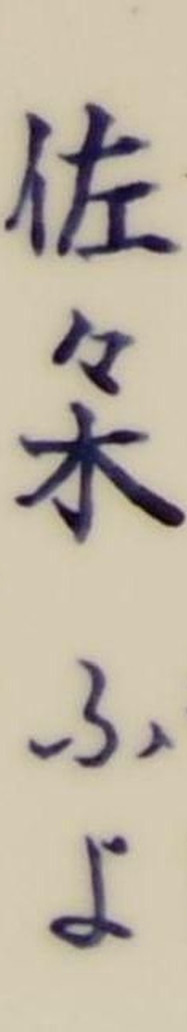佐々木ふよ
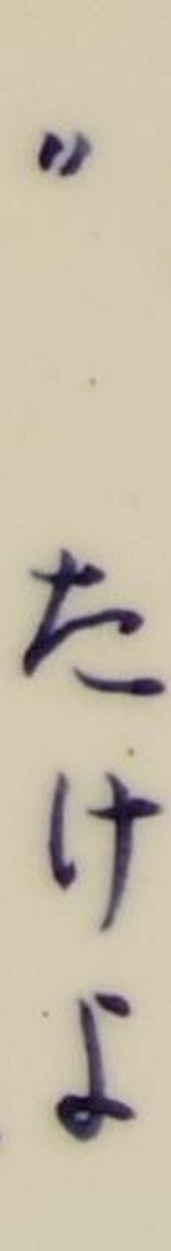たけよ
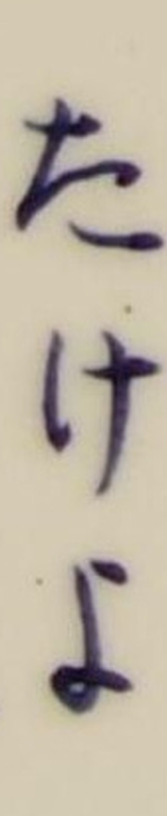たけよ
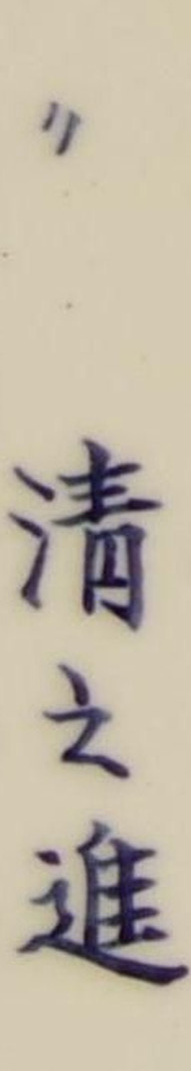清之進
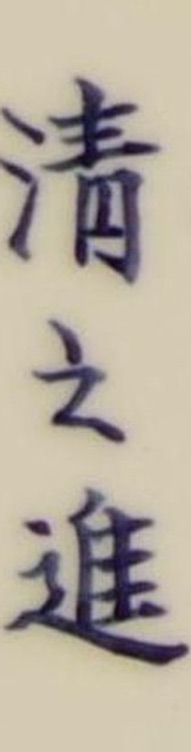清之進
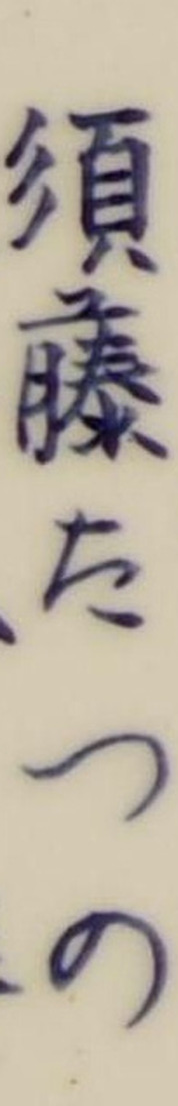須藤たつの
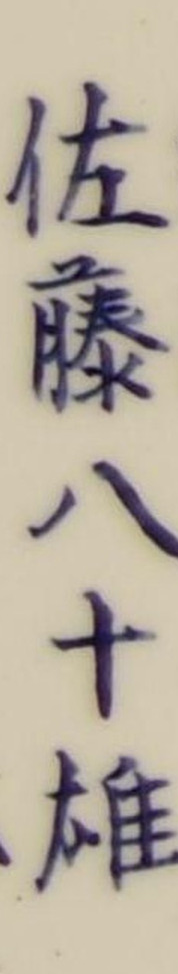佐藤八十雄

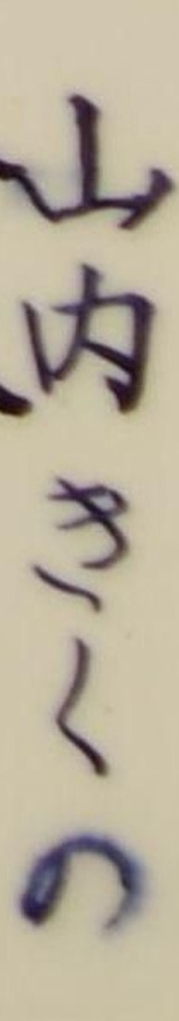山内きくの
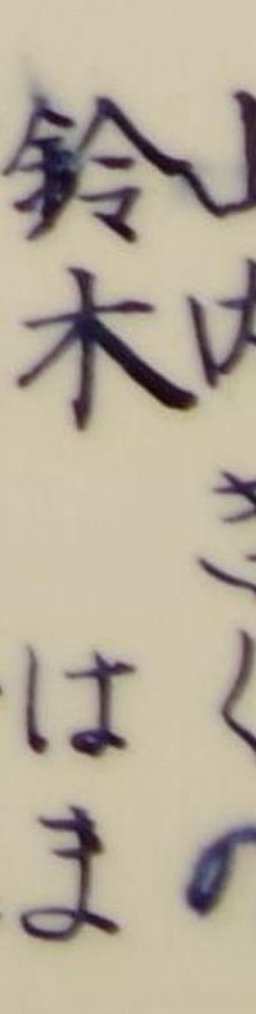鈴木はま
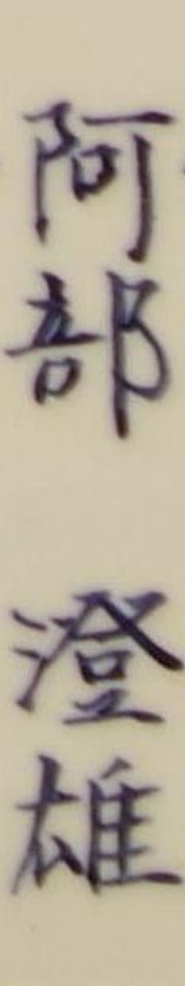阿部澄雄
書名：A~D
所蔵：koyasan kongobuji
